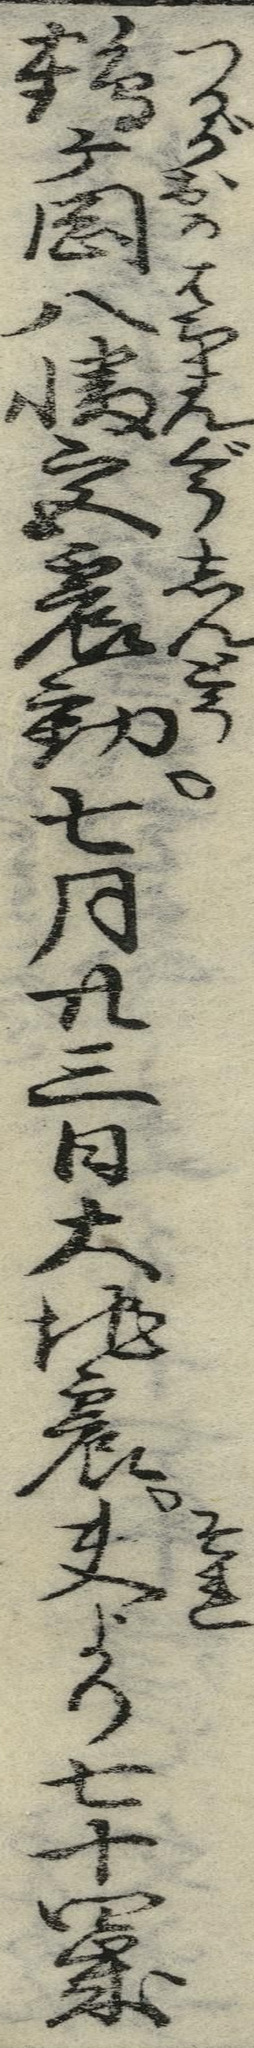鶴ヶ岡八幡宮震動。七月廿三日大地震。夫より七十四歳
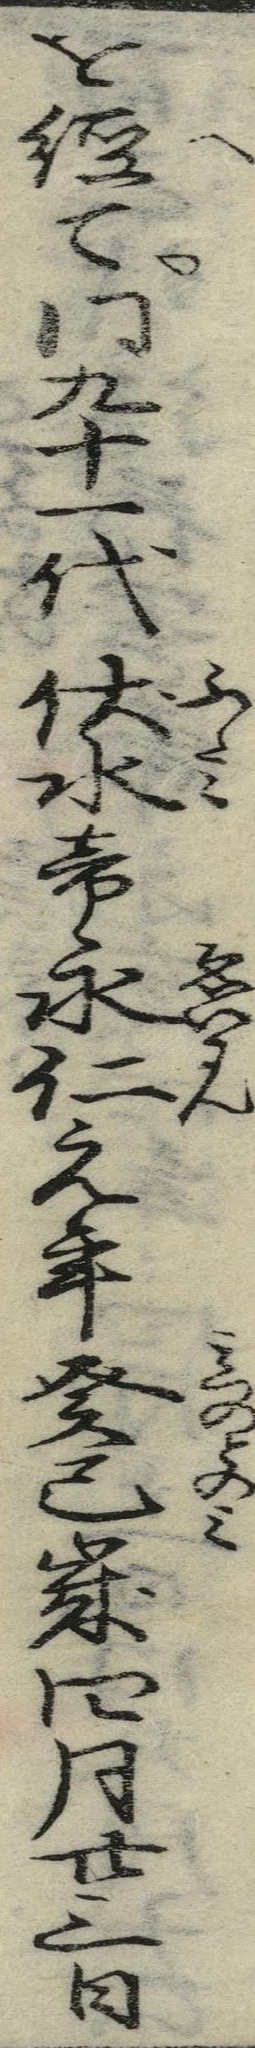を経て。同九十一代伏水帝永仁元年癸巳歳四月廿三日
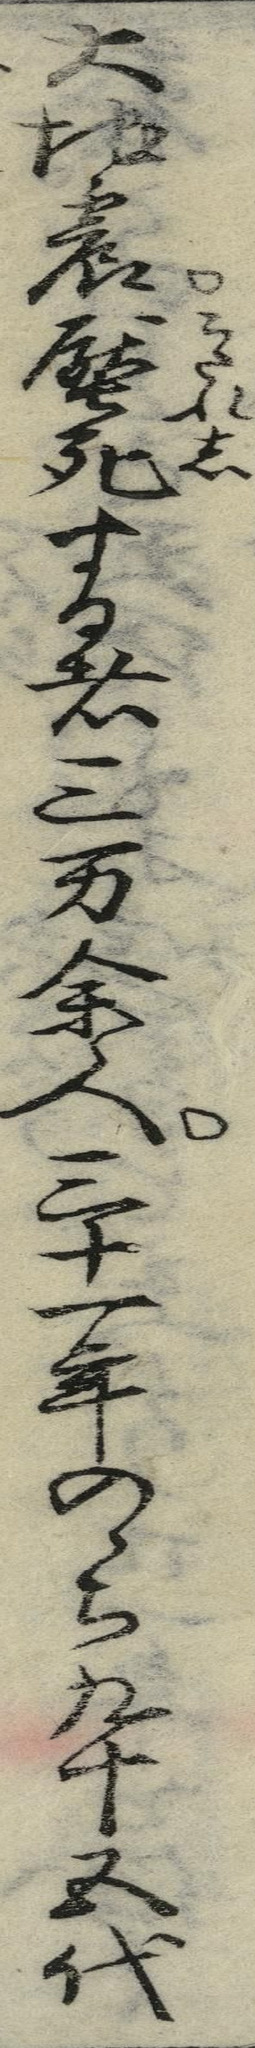大地震。圧死する者三万余人。三十一年のゝち九十五代
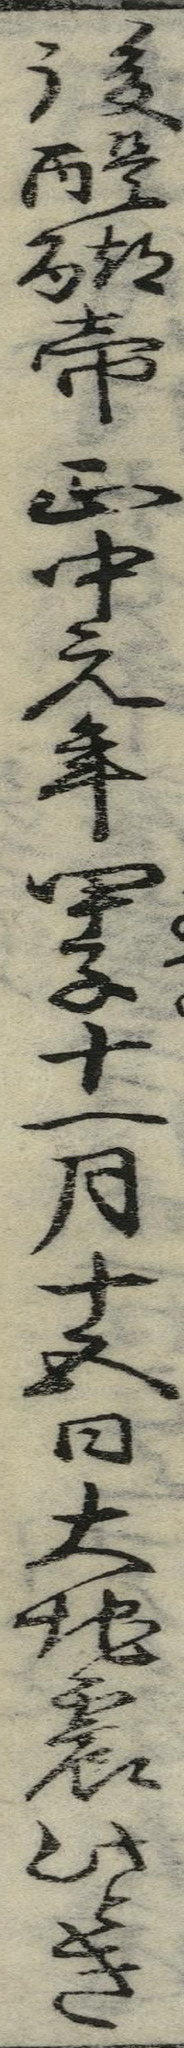後醍醐帝正中元年甲子十一月十五日大地震。此とき
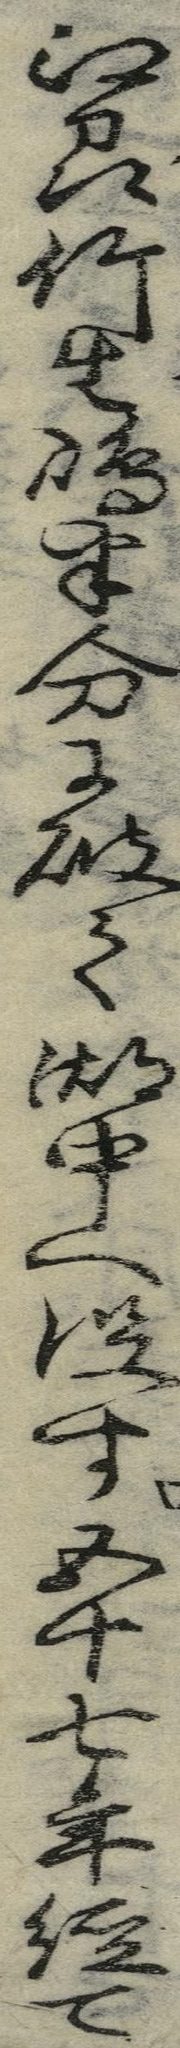江州竹生嶋半分に破て湖中へ没す。五十七年経て
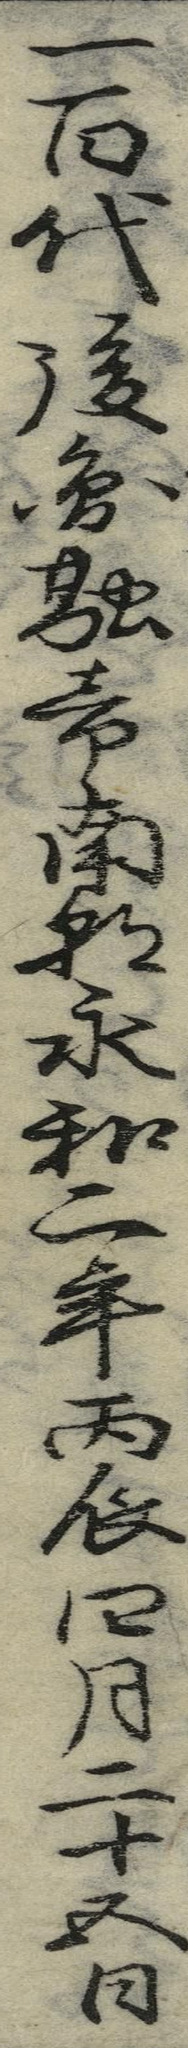一百代後円融帝南朝永和二年丙辰四月二十五日

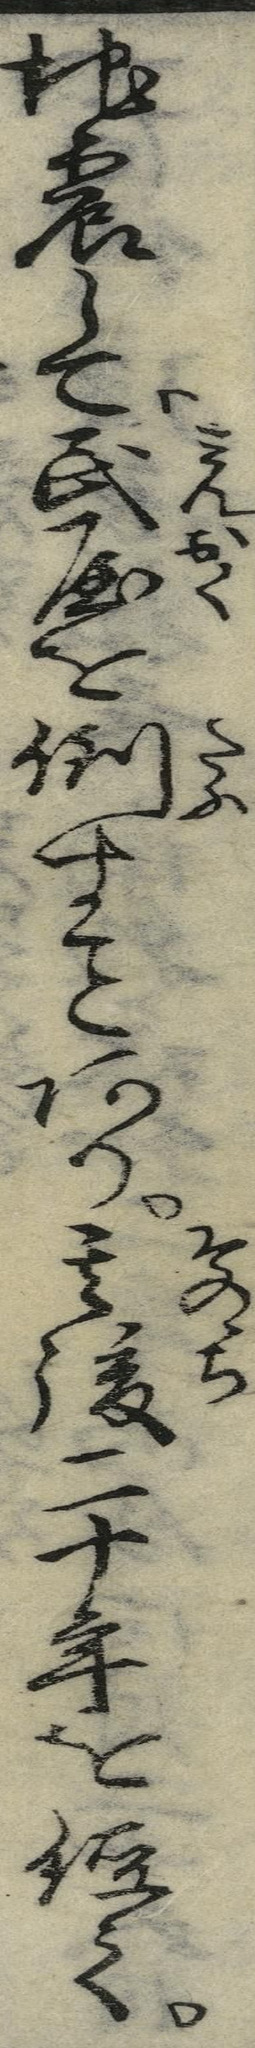地震して。民屋を倒すことあり。其後二十年を経て。
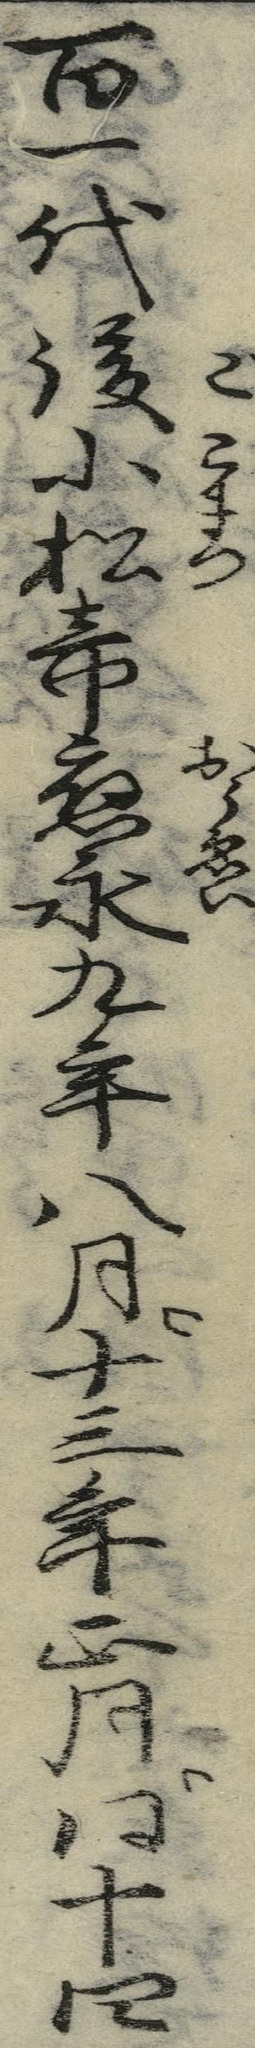百一代後小松帝応永九年八月。十三年正月。同十四
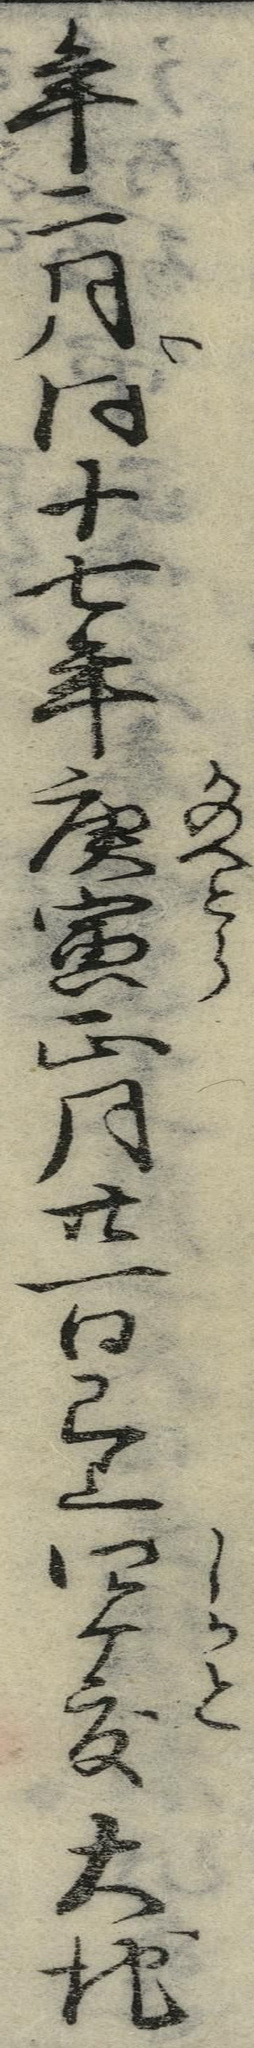年二月。同十七年庚寅正月廿一日已上四ヶ度大地
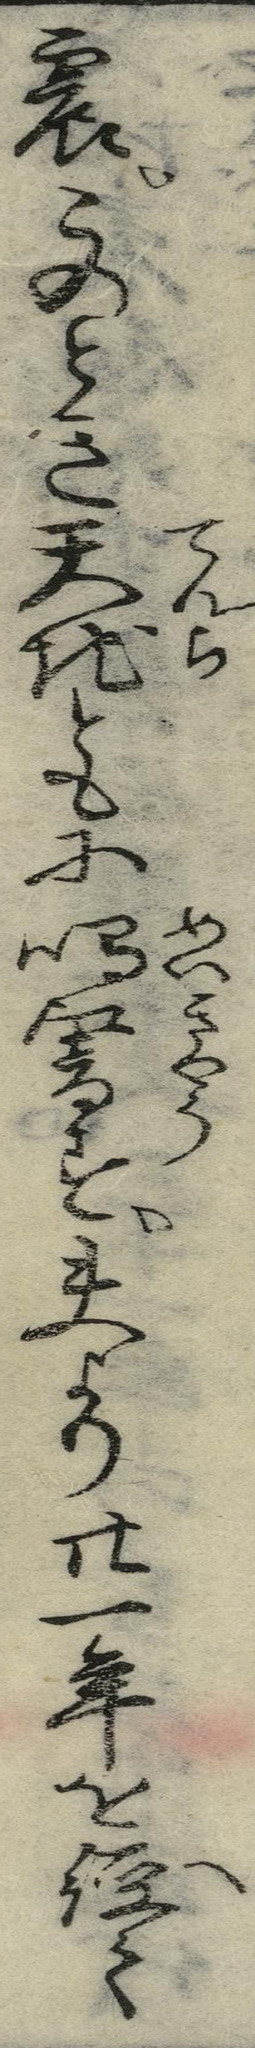震。このとき天地ともに鳴響す。夫より廿一年を経て
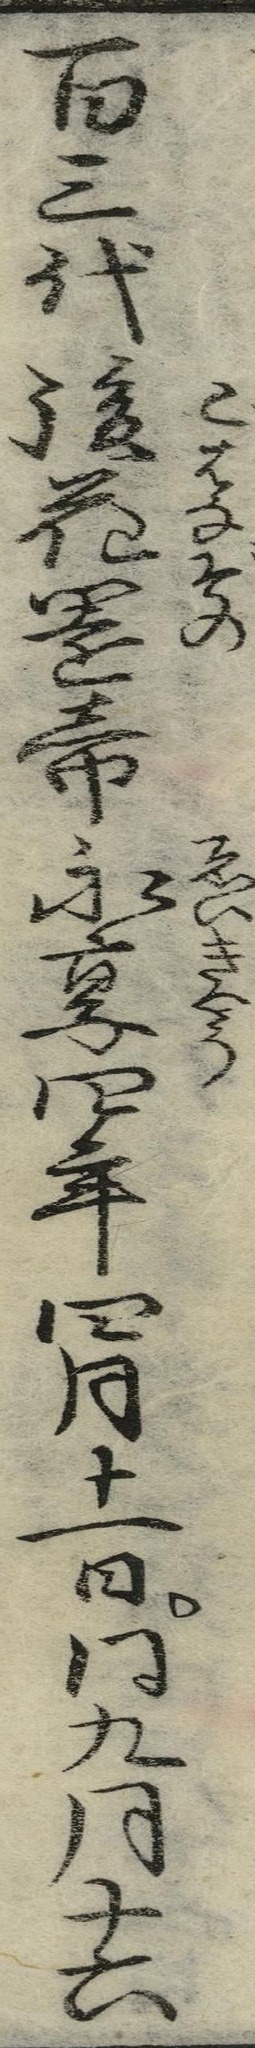百三代後花園帝永享四年四月十一日。同九月十六
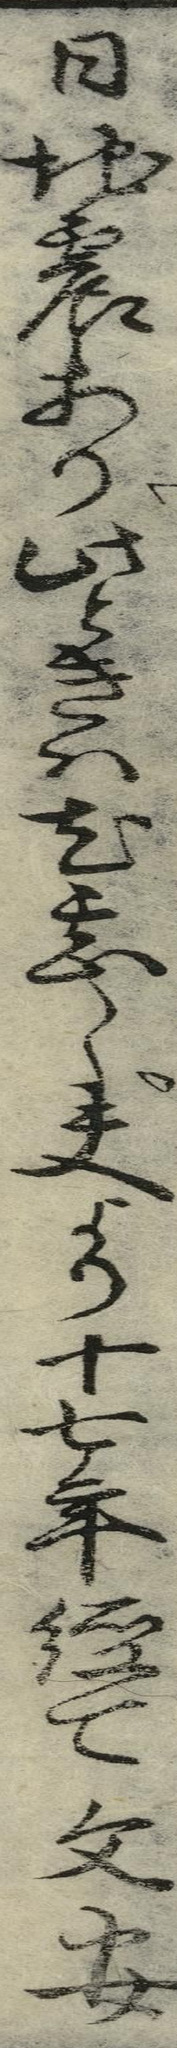日地震あり。此ときは尤甚し。夫より十七年経て文安
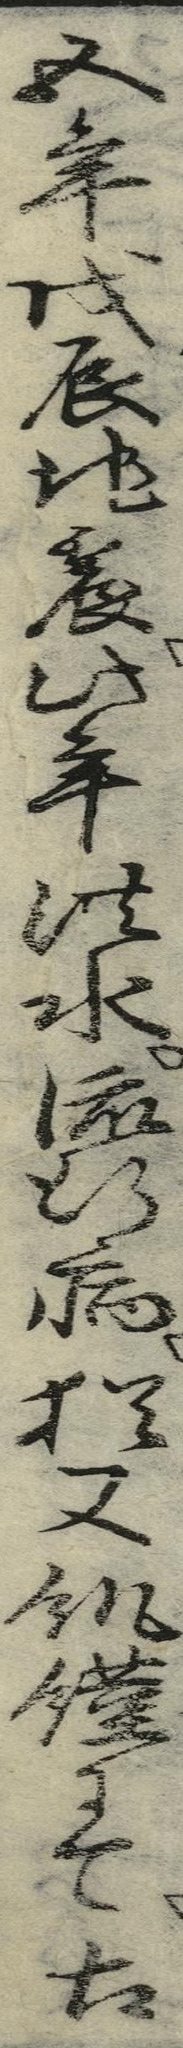五年戊辰地震。此年洪水。流行病。猶又飢饉にて。古
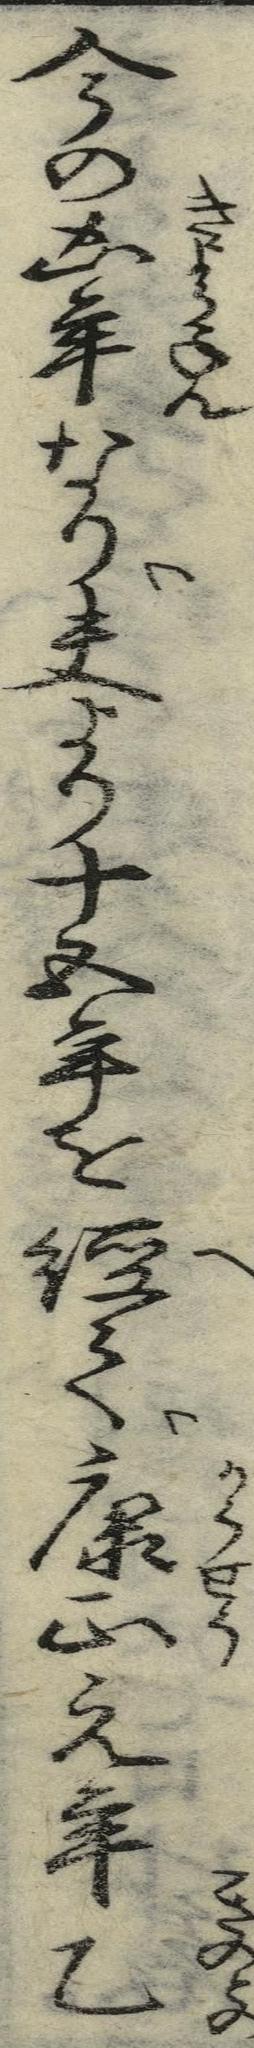今の凶年なり。夫より十五年を経て。康正元年乙
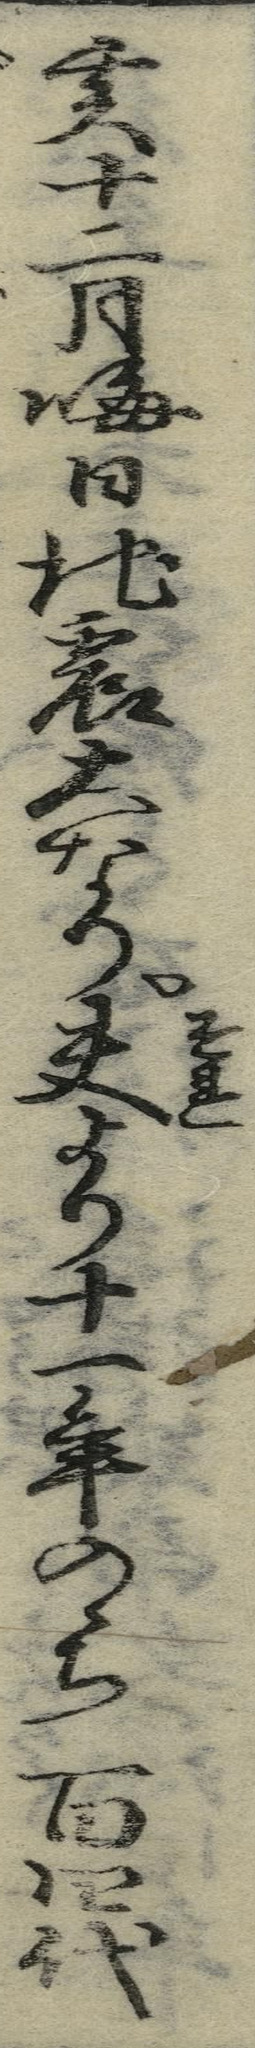亥十二月晦日地震大なり。夫より十一年のち百四代
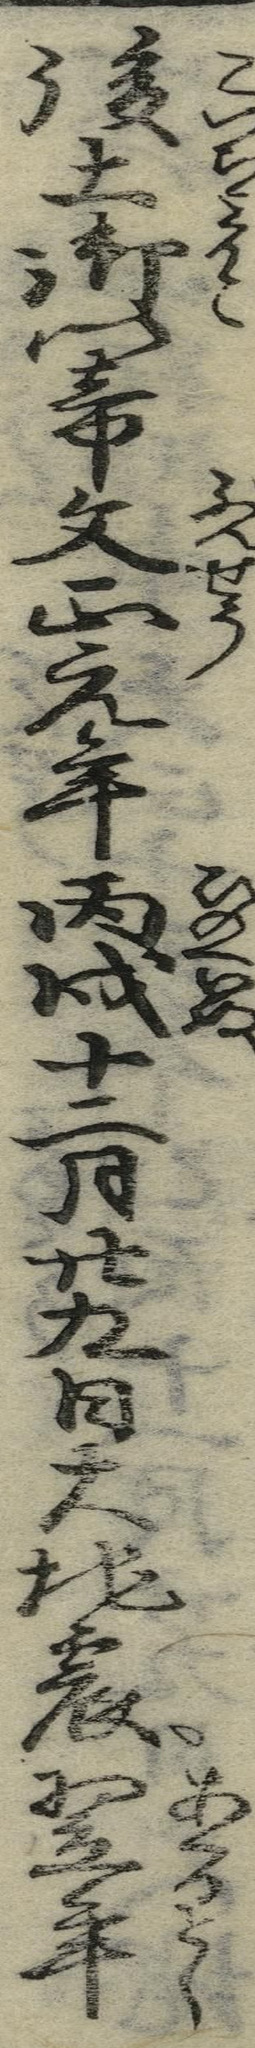後土御門帝文正元年丙戌十二月廿九日大地震。翌年
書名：本朝地震記　全
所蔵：東京大学地震研究所図書室 Earthquake Research Institute Library, The University of Tokyo, JAPAN
